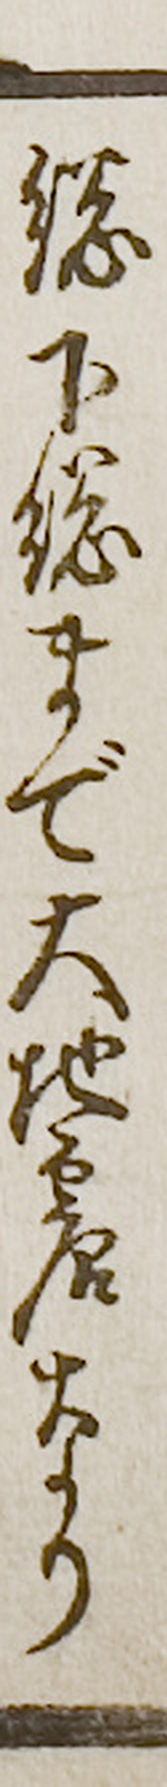総下総まで大地震なり
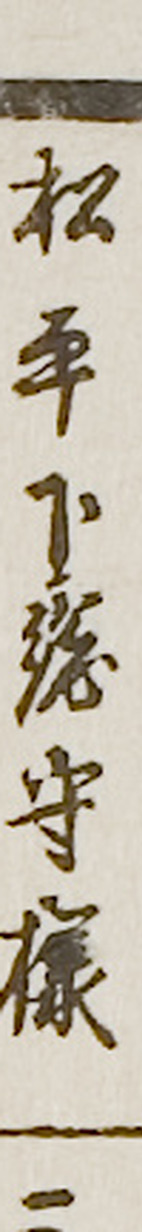松平下総守様
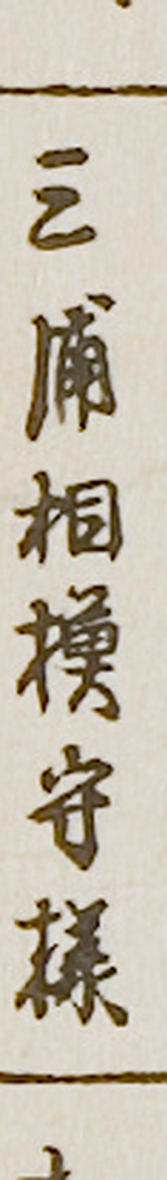三浦相模守様
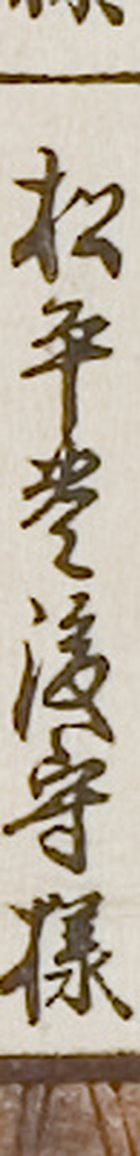松平豊後守様
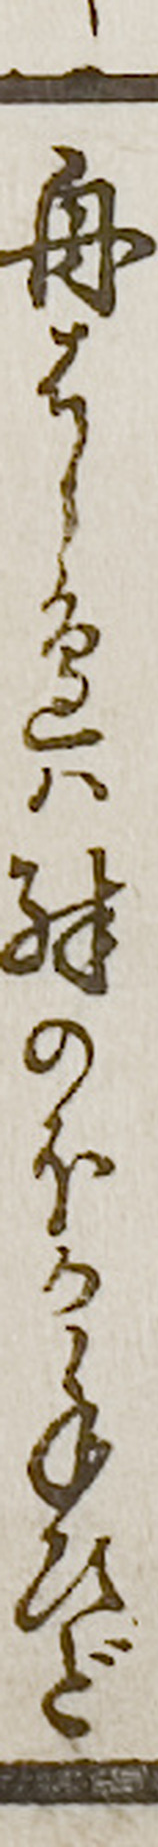舟はし辺ハ殊のほか手ひど
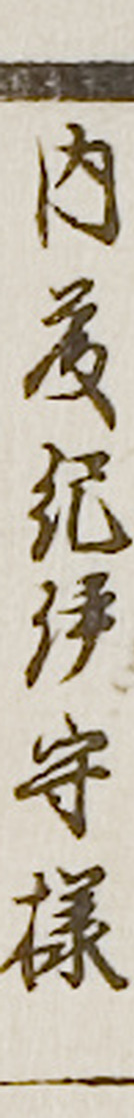内藤紀伊守様
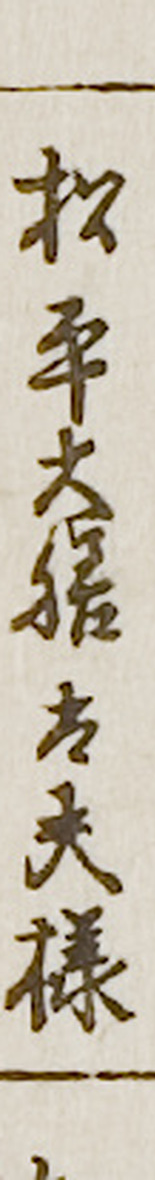松平大膳太夫様
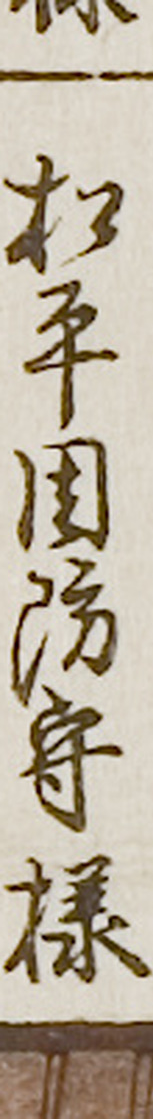松平周防守様
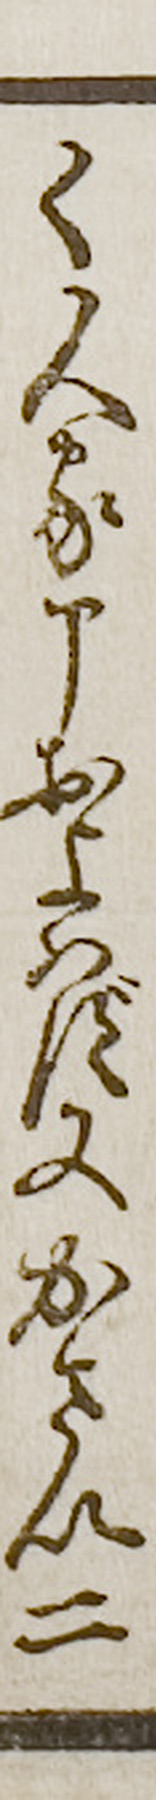く人家申およハず又かさいニ
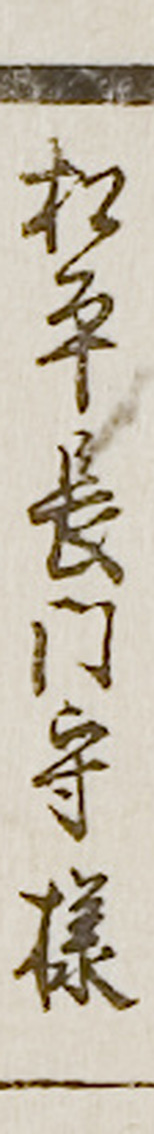松平長門守様
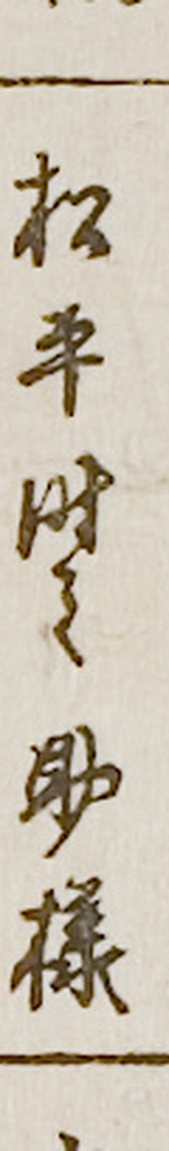松平時之助様
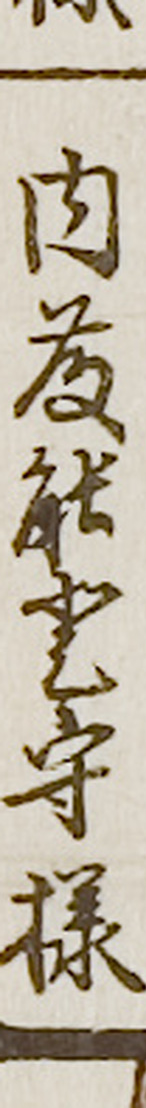内藤能登守様
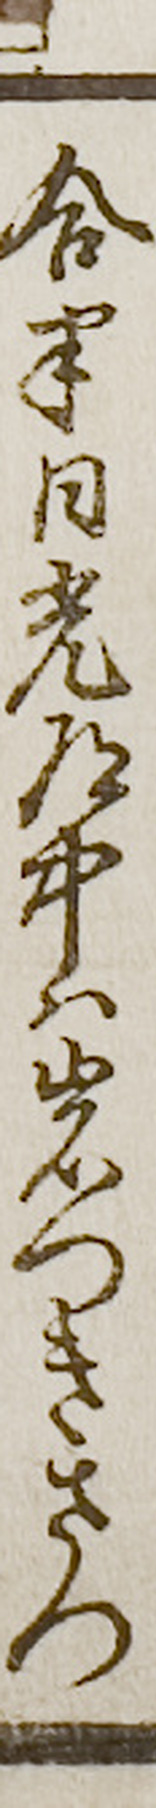合半日光道中ハ岩つきさつ
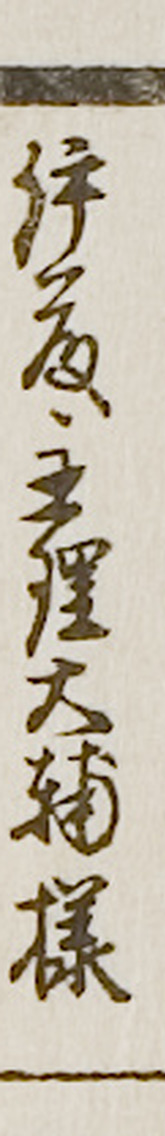伊藤主理大輔様
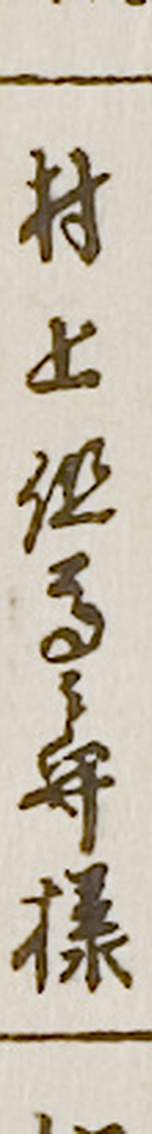村上但馬守様
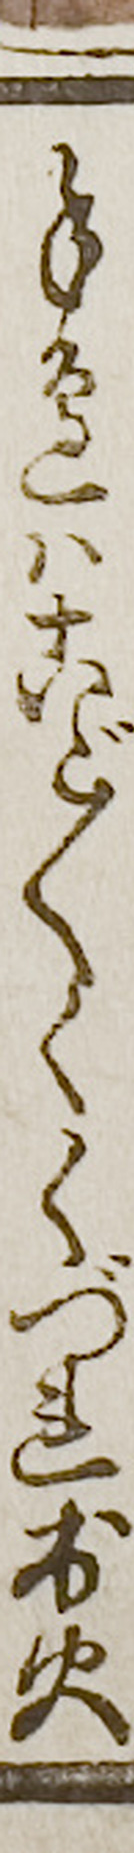手辺ハこと〴〵くくづれ出火
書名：安政二乙卯歳十月二日夜ル四ツ時震始メ末代
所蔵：東京大学総合図書館 General Library in the University of Tokyo, JAPAN
